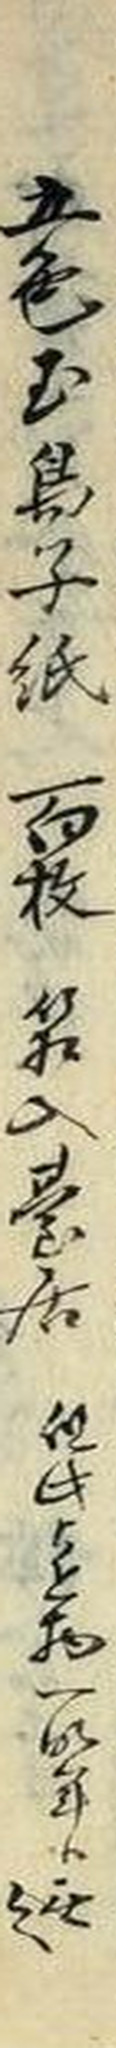五色玉鳥子紙百枚箱入台居但此被進物一昨年ハ無之
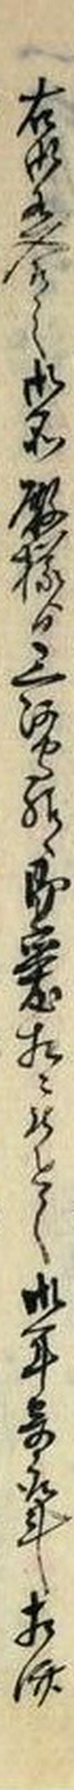右御有合之御品殿様ゟ三河守様へ御愛相ニ被進之御年寄取斗相済
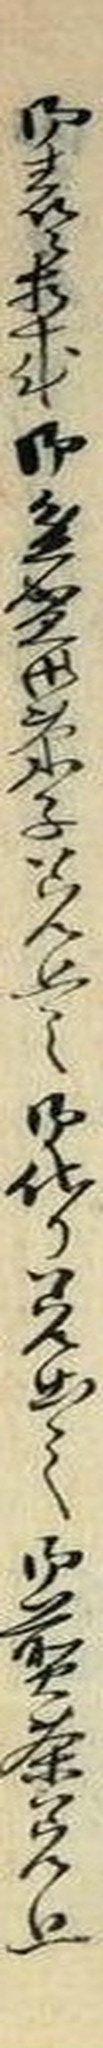御表ニ相成御盆盛御菓子差上之御代り差出之御煎茶差上
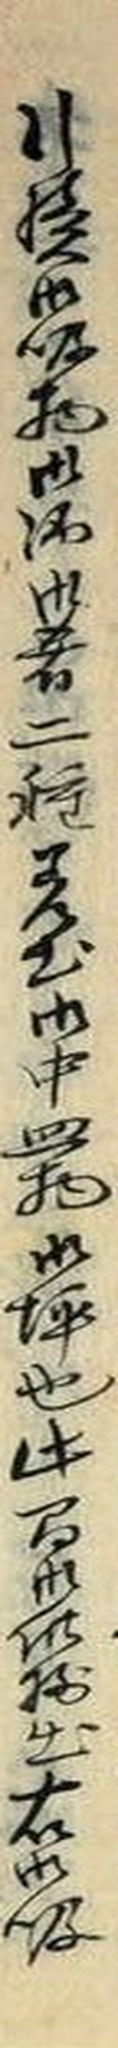引続御吸物御酒御肴二種差出御中皿物御坪也此間御供揃出右御吸
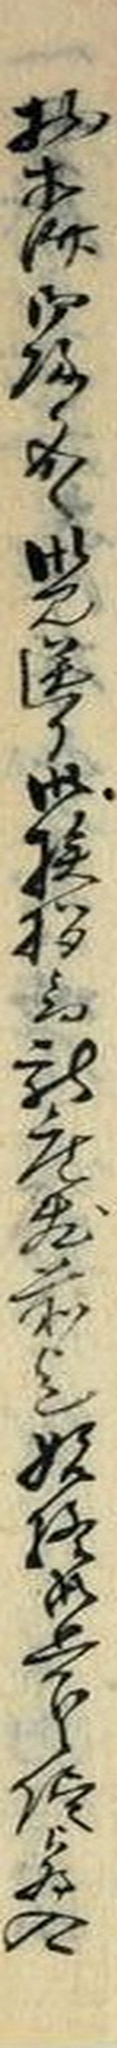物相済御帰被成候御見送り御挨拶ニ而新座敷前迄始終御上下之儘被為入候

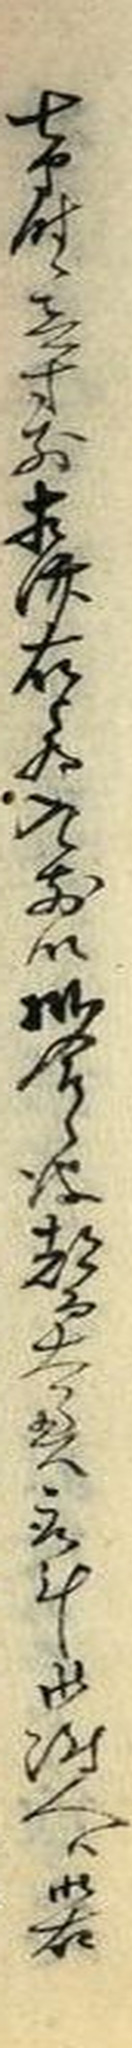七半時ニ壱寸前相済右被為入候前御掛合之儀都而大奥取斗御附人ハ御右
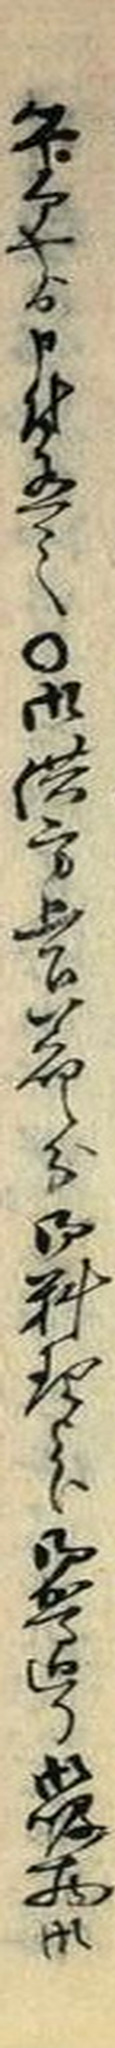筆部やゟ申付有之○御供方上下着候分御料理被下御駕廻り御吸物御
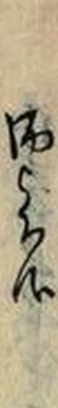酒被下候
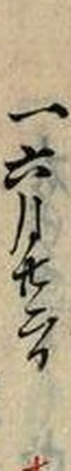一六月廿二日
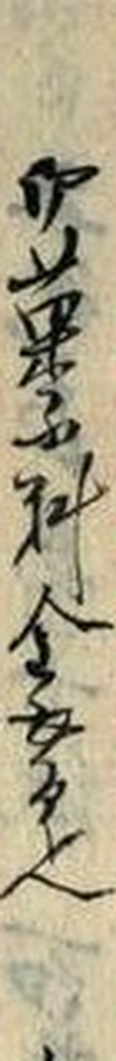御肴代金五百疋
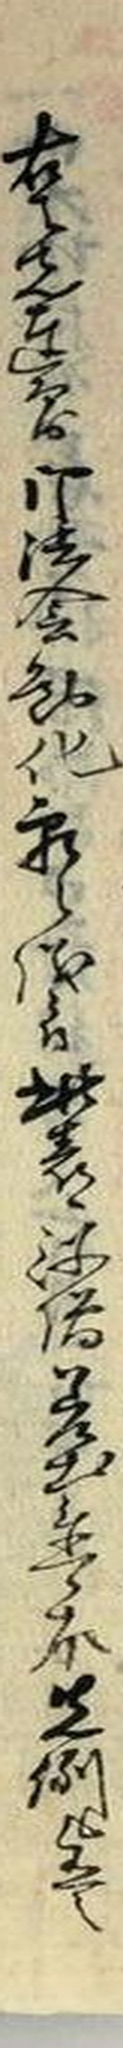右者先達而ゟ御法会勧化願之儀ニ付此表へ役僧差出置候故先例も有之
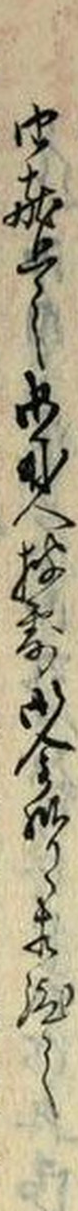御献上之御用人披露御金掛りへ相渡之
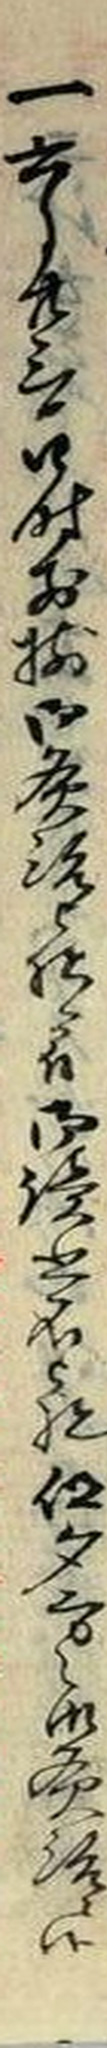一六月廿三日四時前揃御灸治被遊候ニ付御読書不被遊但夕方之御灸治ニ候
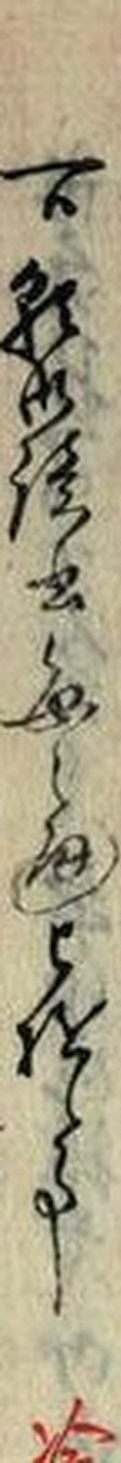へハ朝御読書毎之通被遊候事
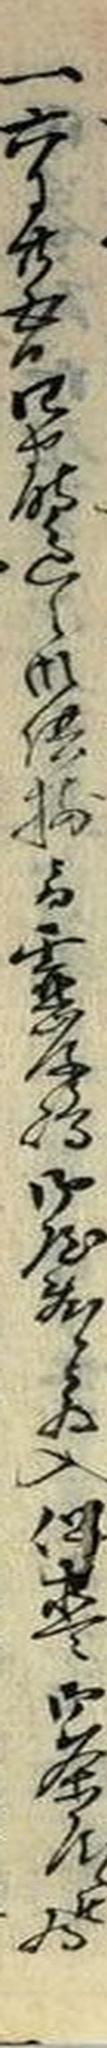一六月廿五日四半時過之御供揃ニ而霊岸嶋御屋敷へ被為入但直ニ御茶屋へ被為
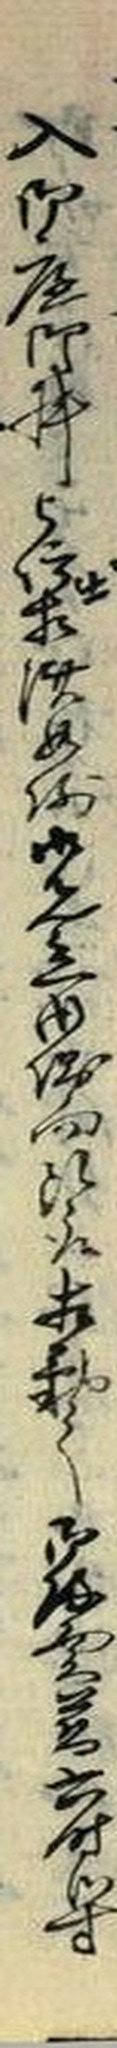入御庭御拝被仰出相済如例御先立御側向頭取相勤之御帰殿暮六時弐寸
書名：少傅日録抄（斉承付側向頭取日記、在府）
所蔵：福井県文書館 Fukui Prefectural Archives
